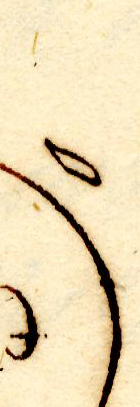To
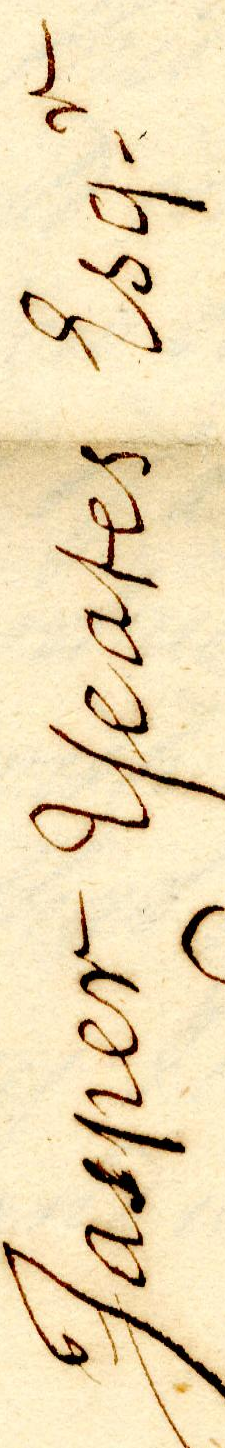Jasper Yeates Esq^r.
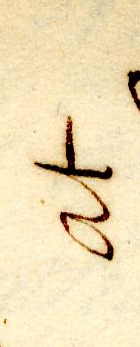at
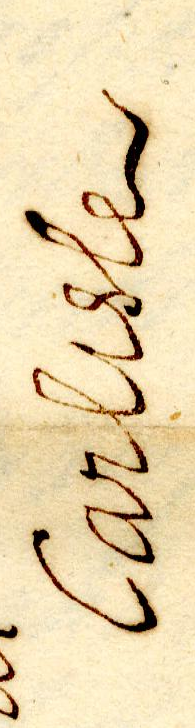Carlisle
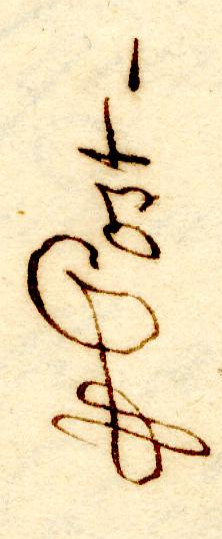Per Post
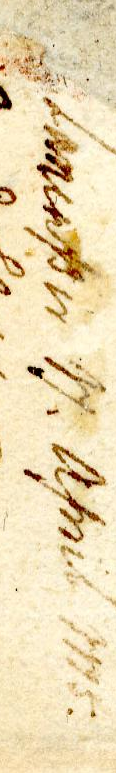Lancaster 17. April 1775
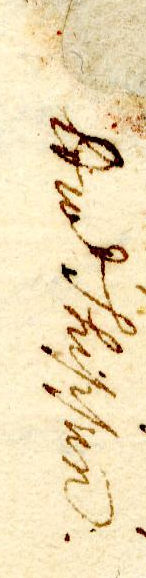Edw^d Shippen
